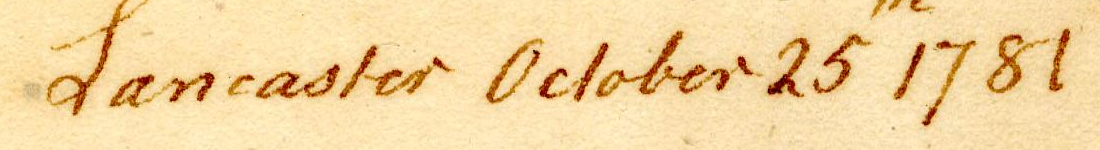Lancaster October 25 1781
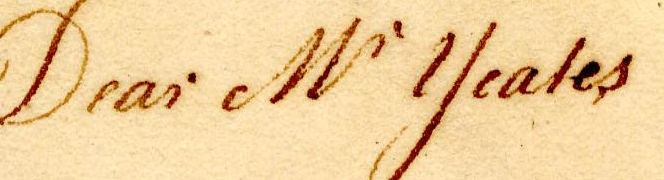Dear M^r Yeates
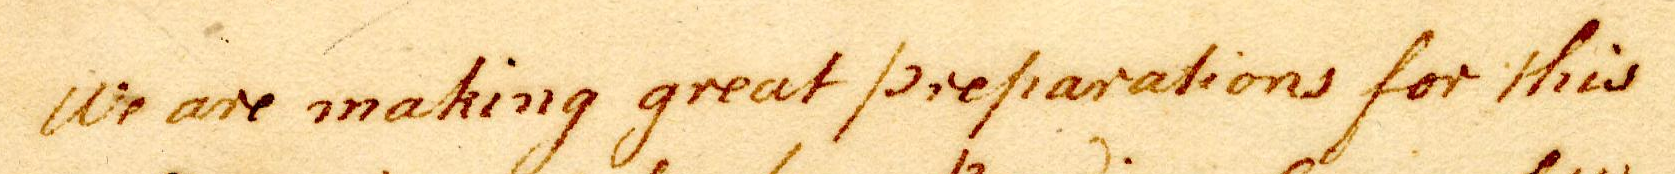We are making great preparations for this
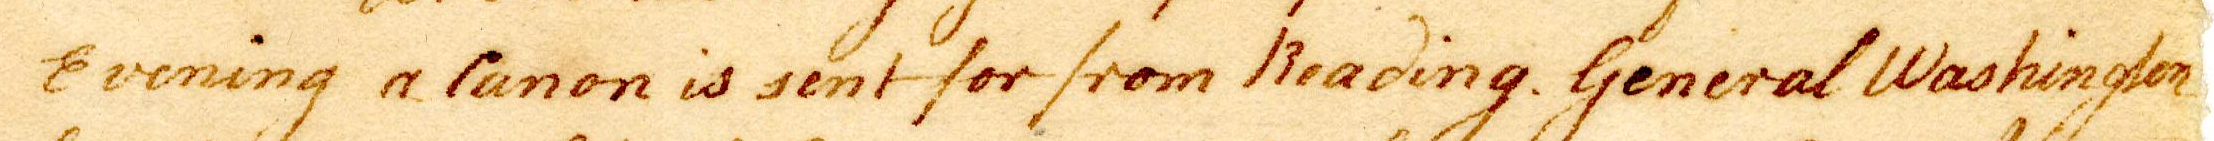Evening a Canon is sent for from Reading. General Washington
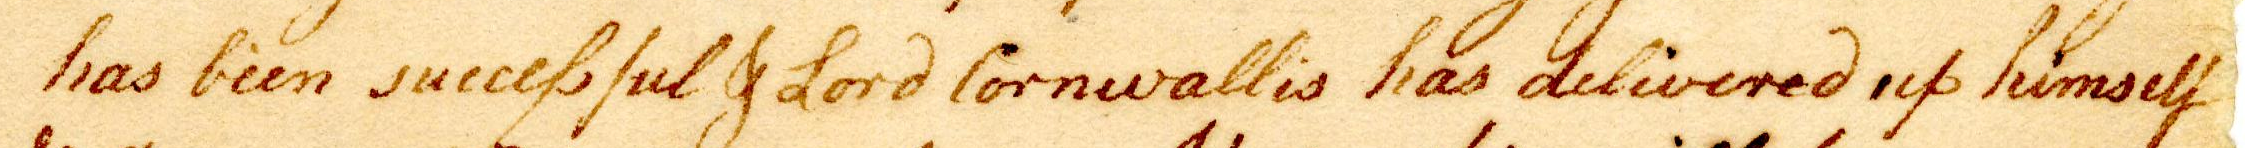has been successful & Lord Cornwallis has delivered up himself
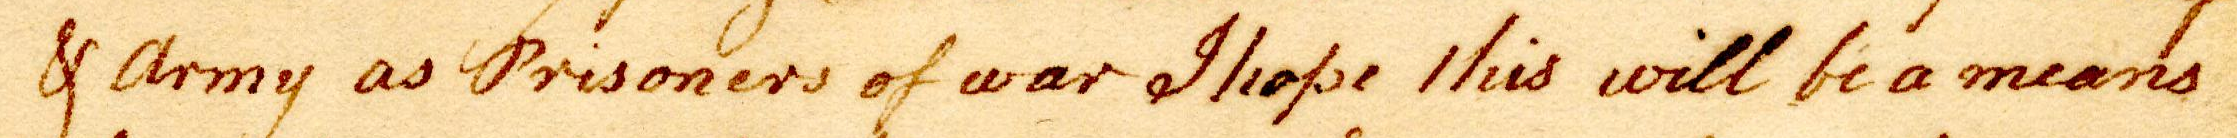& army as Prisoners of war I hope this will be a means
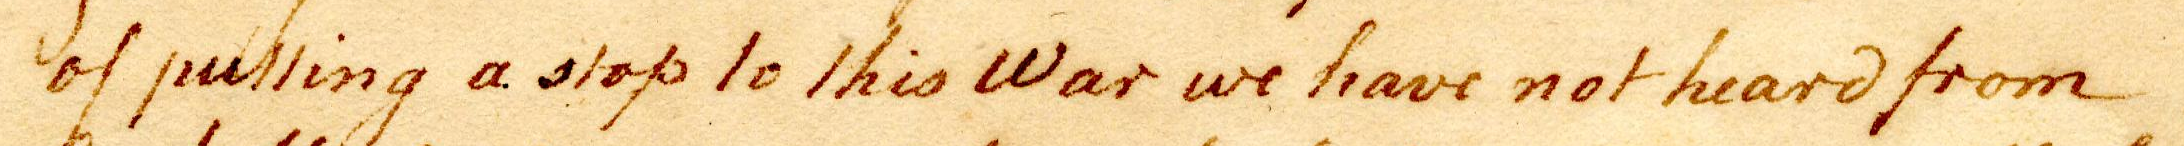of putting a stop to this war we have not heard from
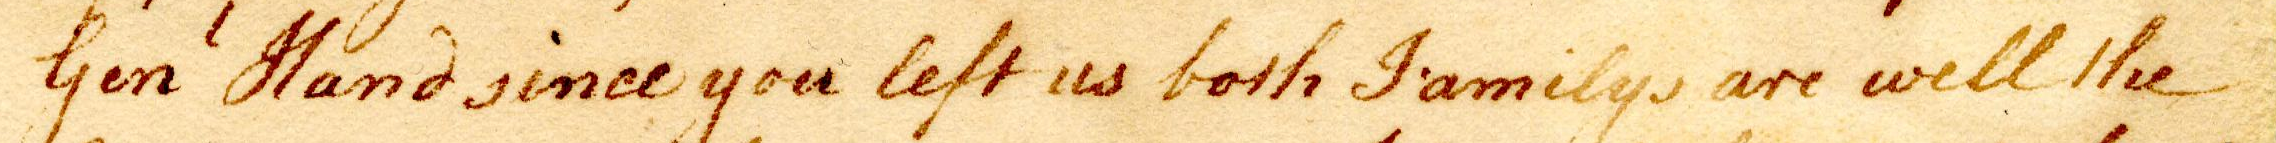Gen Hand since you left us both Familys are well the
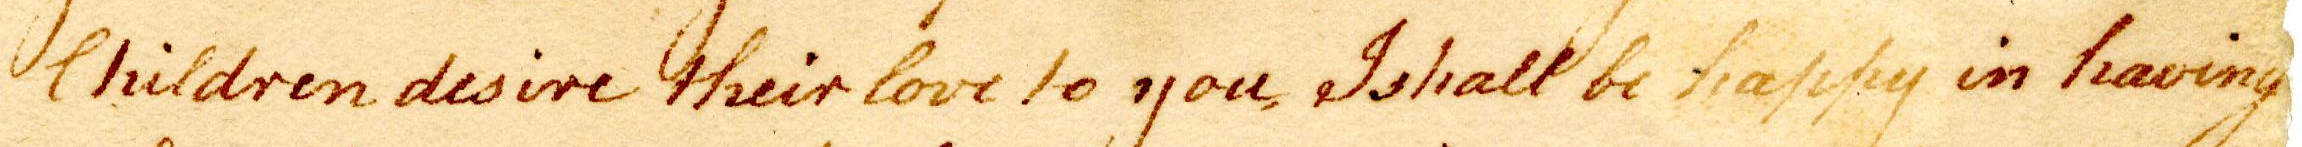Children desire their love to you, I shall be happy in having
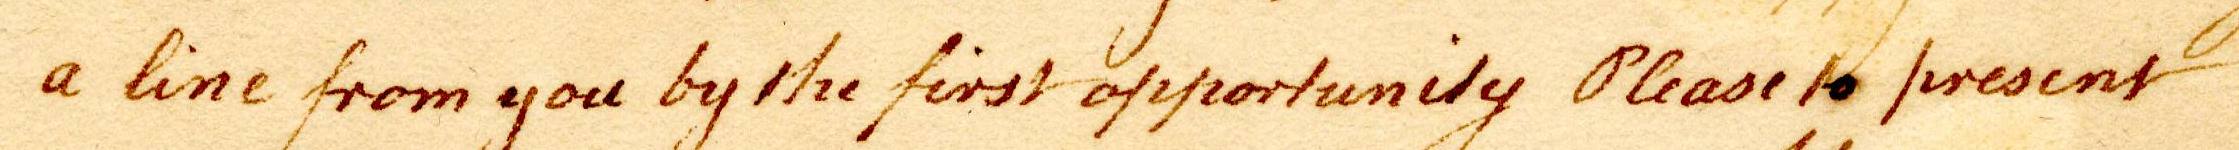a line from you by the first opportunity Please to present
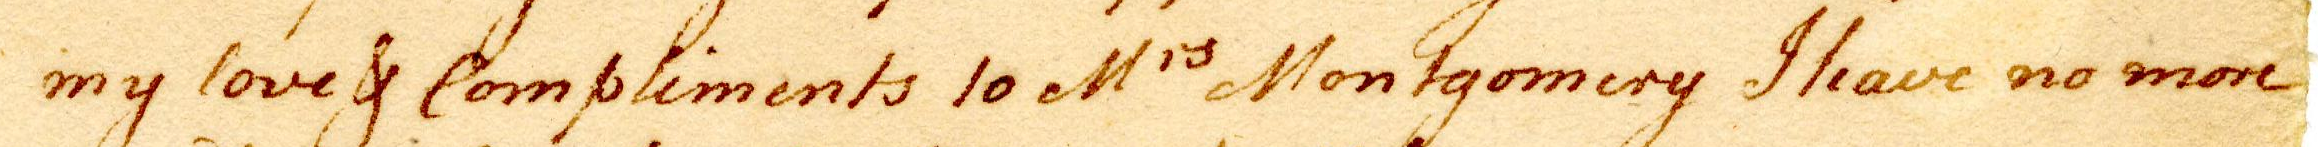my love & Compliments to M^rs Montgomery I have no more
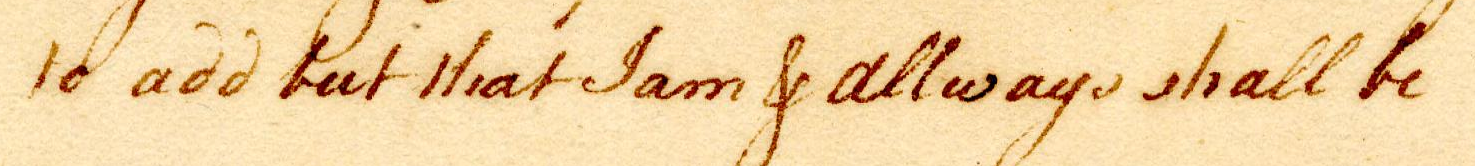to add but that I am & allways shall be
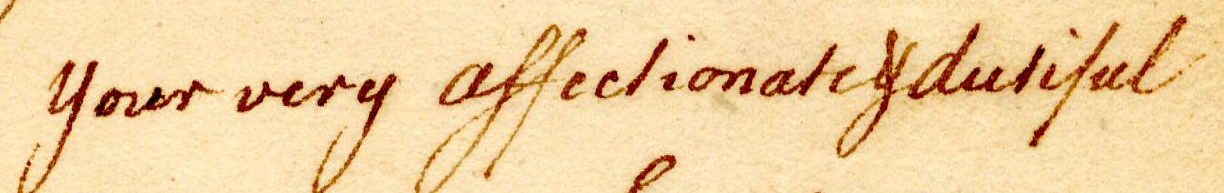Your very affectionate & dutiful
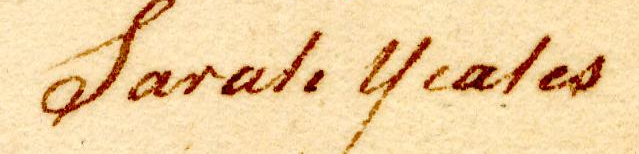Sarah Yeates
